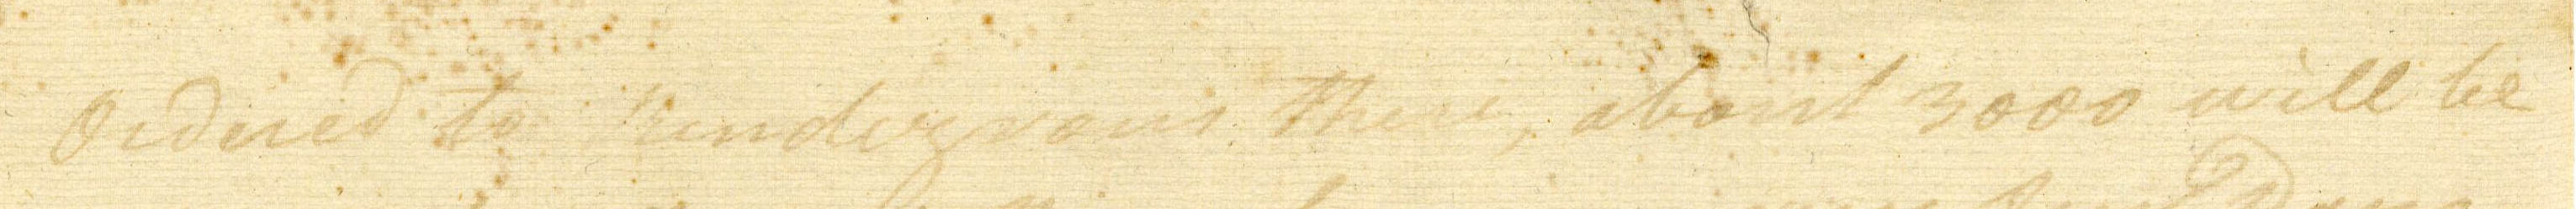ordered to rendezvous there, about 3000 will be
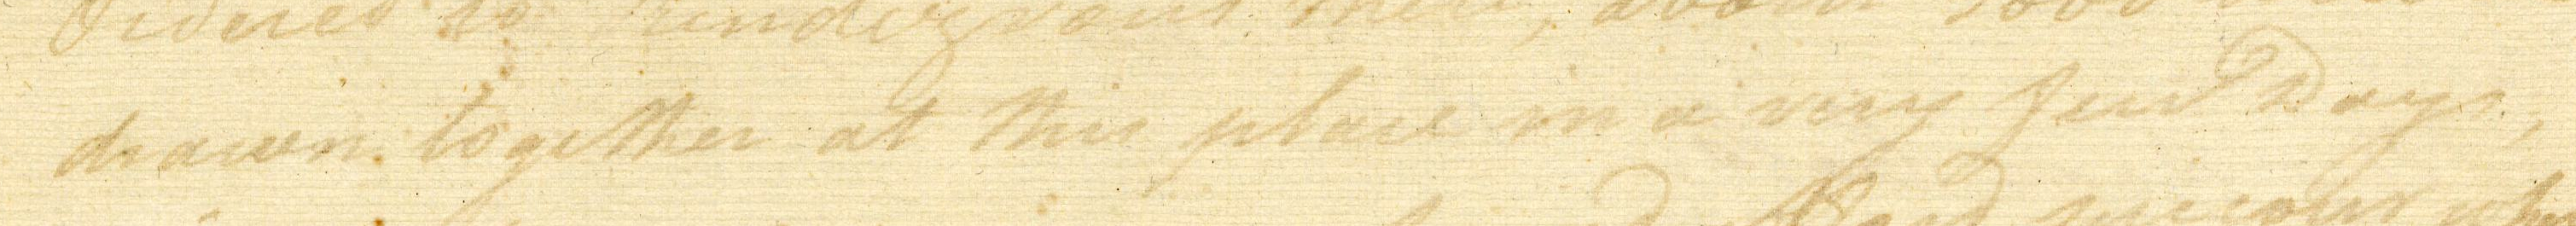drawn together at this place in a very few days,
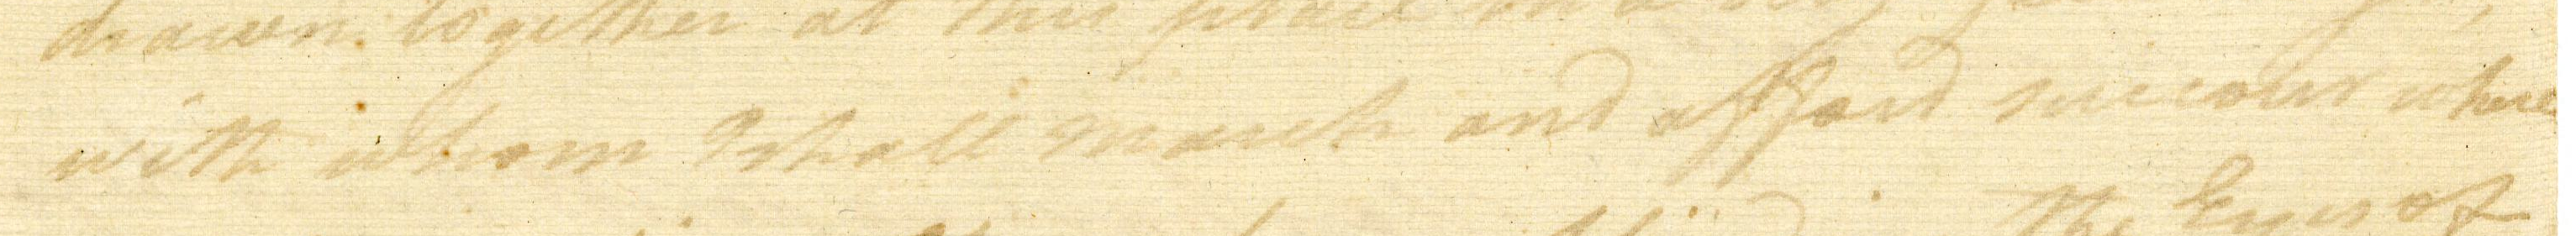with whom I shall march and afford succour where
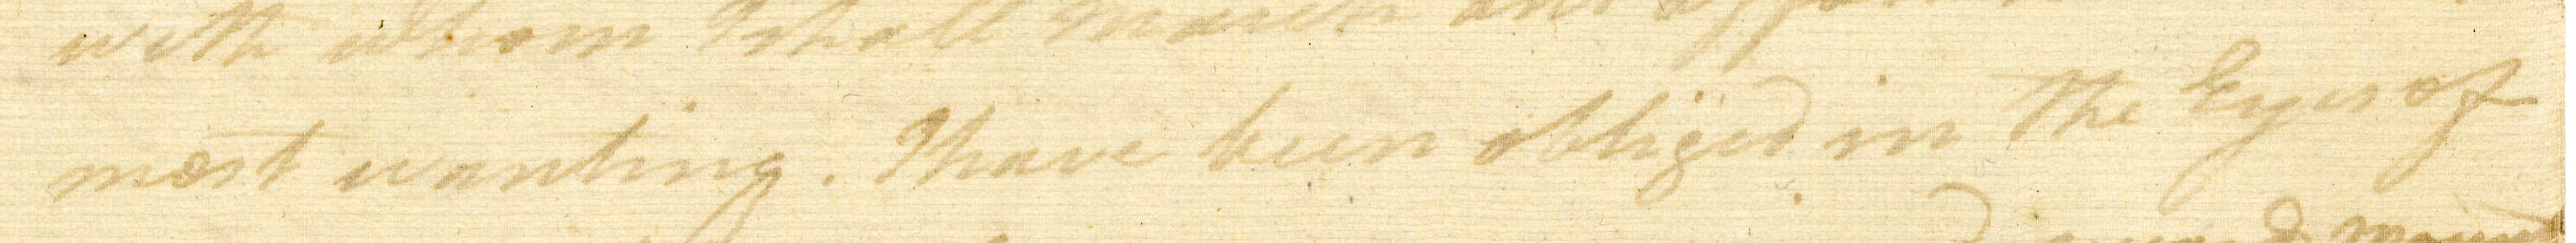most wanting. I have been obliged in the Eyes of
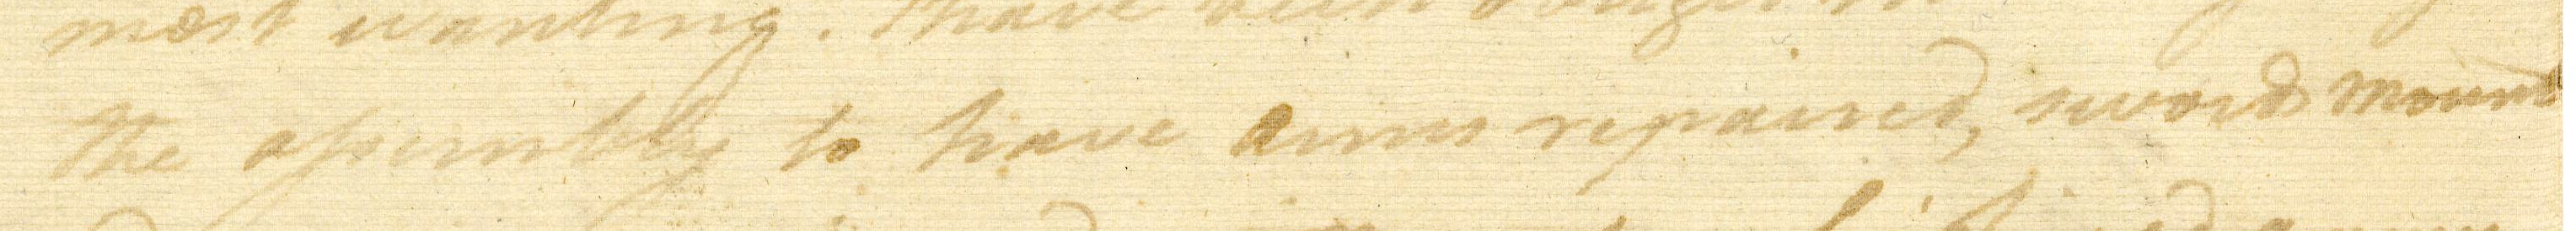the assembly to have arms repaired, swords mount
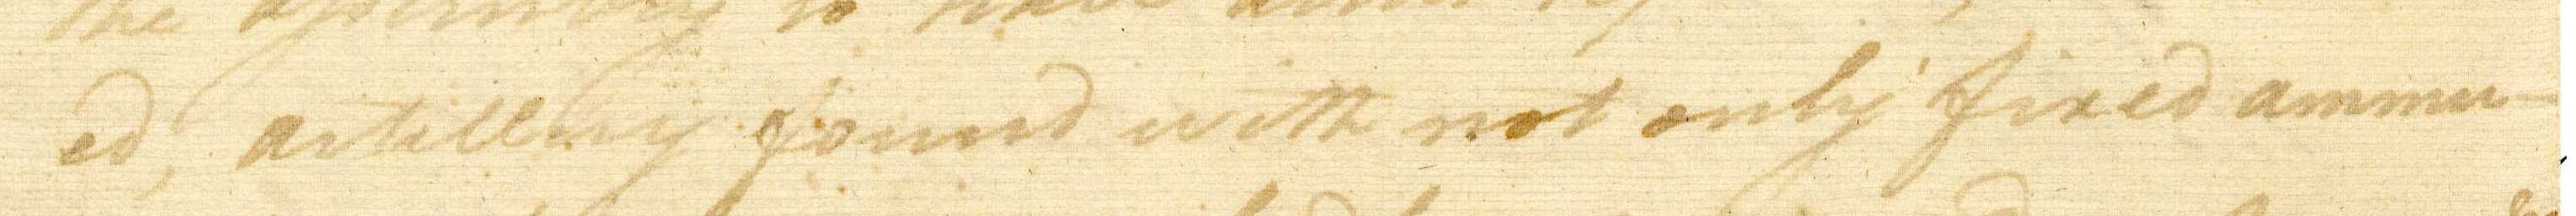ed, artillery found with not only fixed ammu-
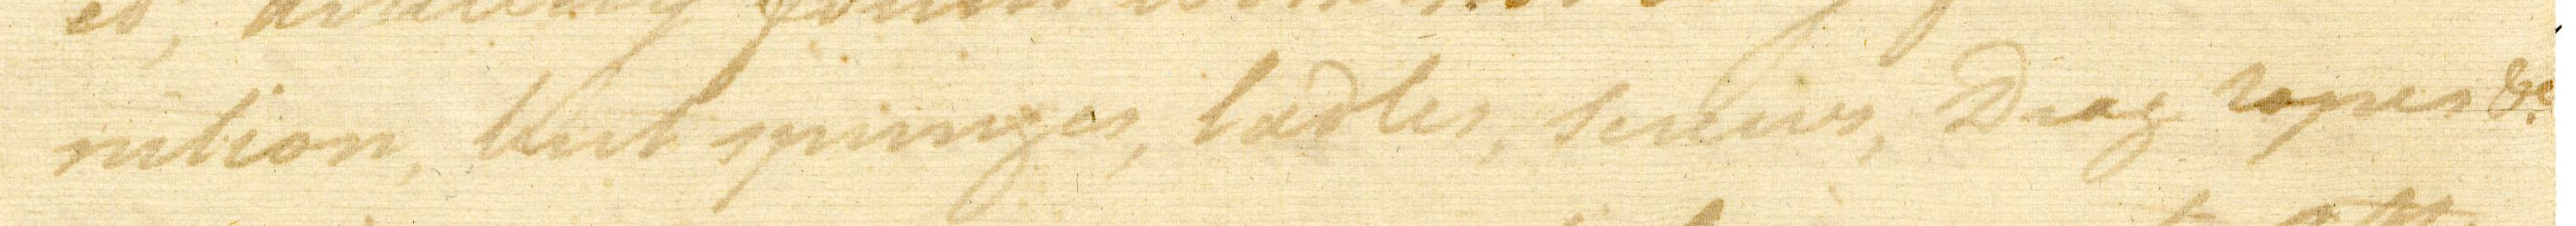nition, but spunges, ladles, screws, Drag ropes &c.
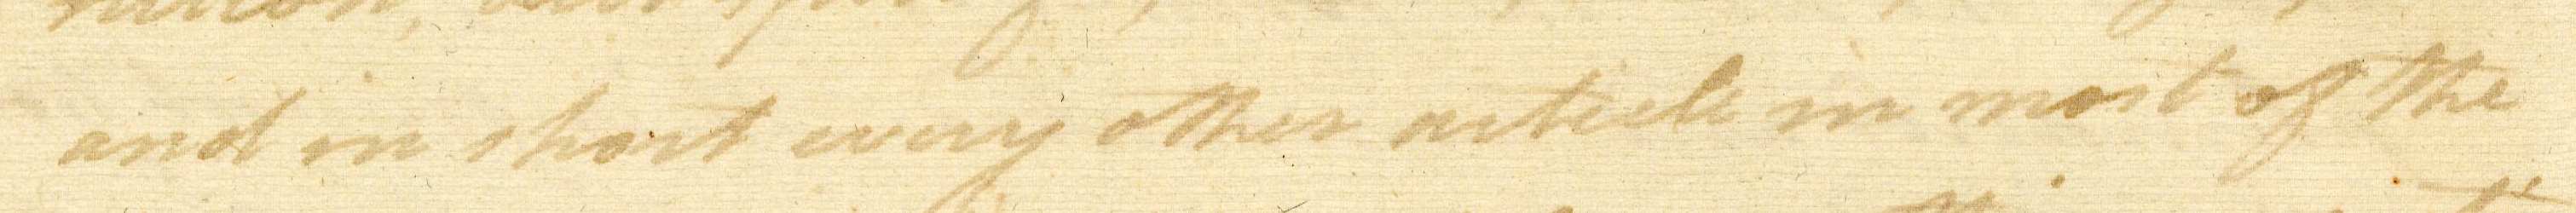and in short every other article in most of the
